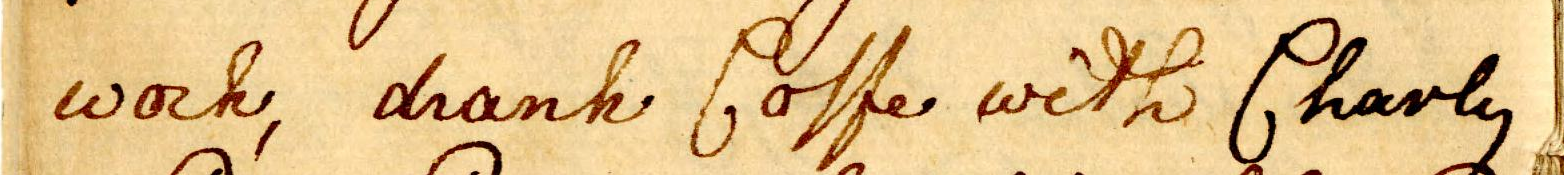work, drank Coffe with Charly
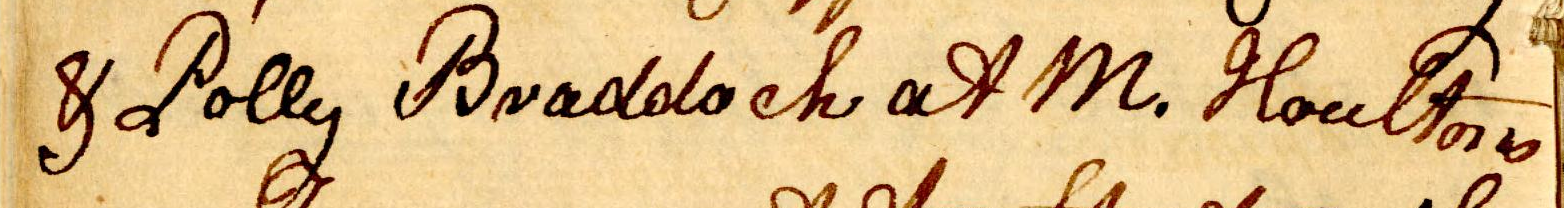& Polly Braddock at M. Houltons
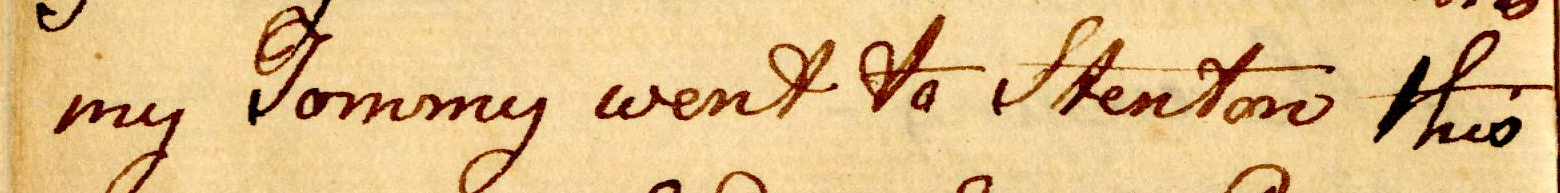my Tommy went to Stenton this
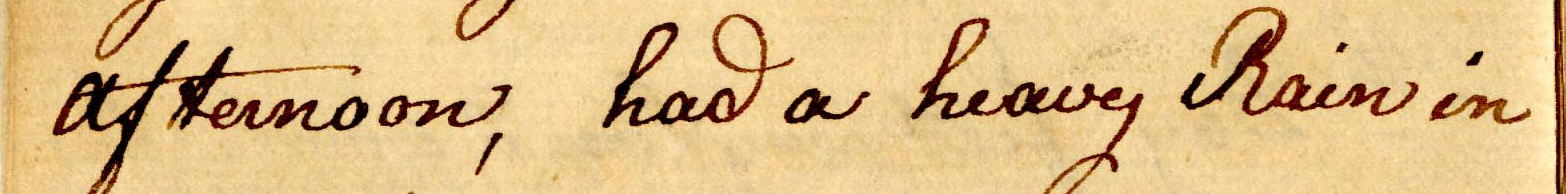Afternoon, had a heavy Rain in
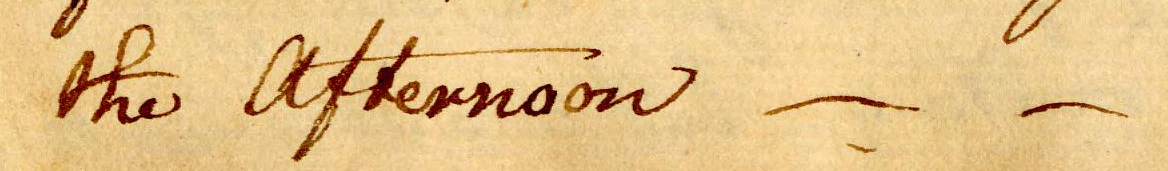the Afternoon--
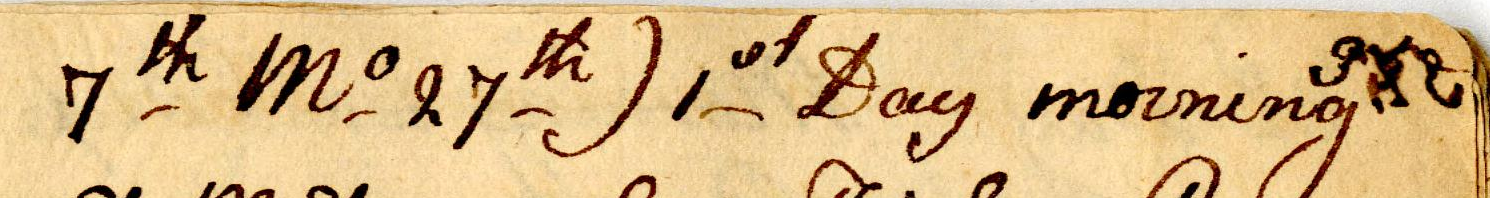7^th M^o 27^th ) 1^st Day
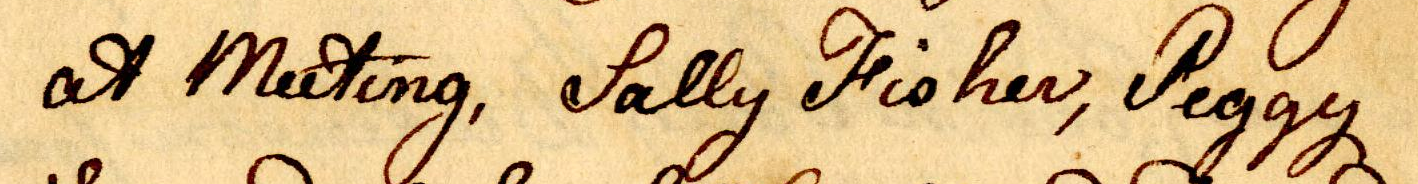at Meeting, Sally Fisher, Peggy
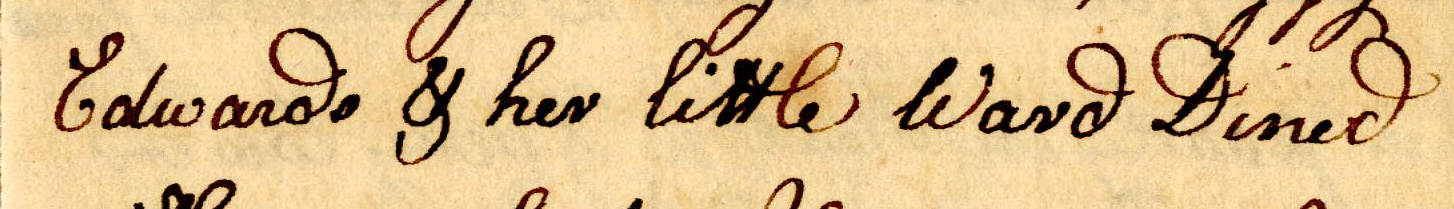Edwards & her little Ward Dined
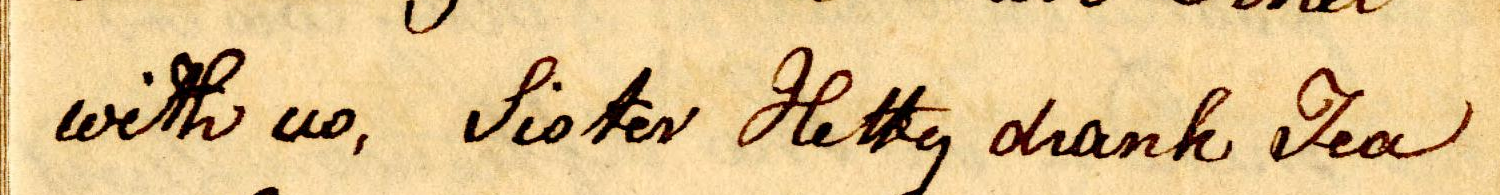with us, Sister Hetty drank Tea
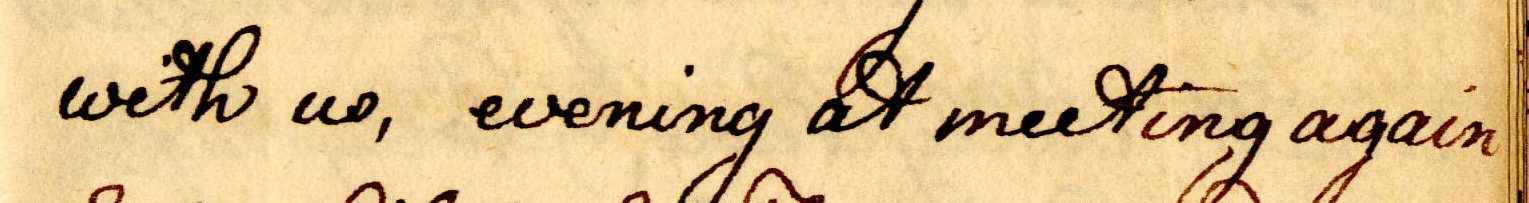with us, evening at meeting again
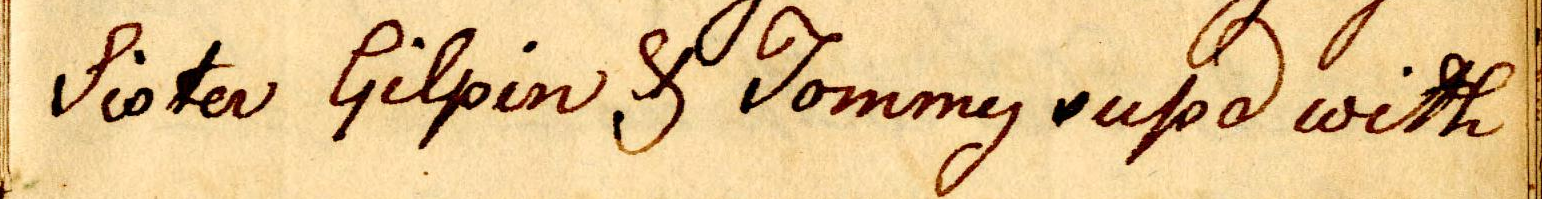Sister Gilpin & Tommy supd with
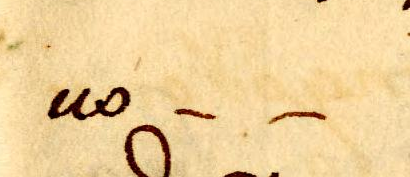us--
